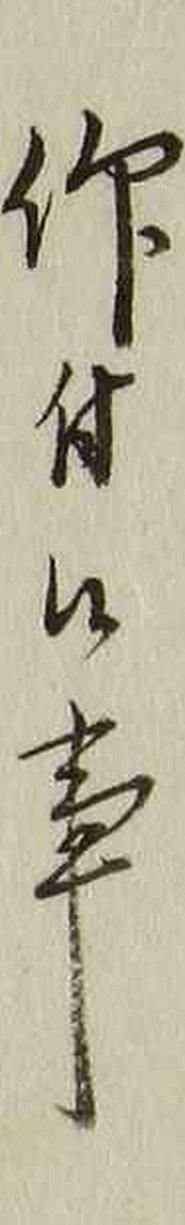仰付候事
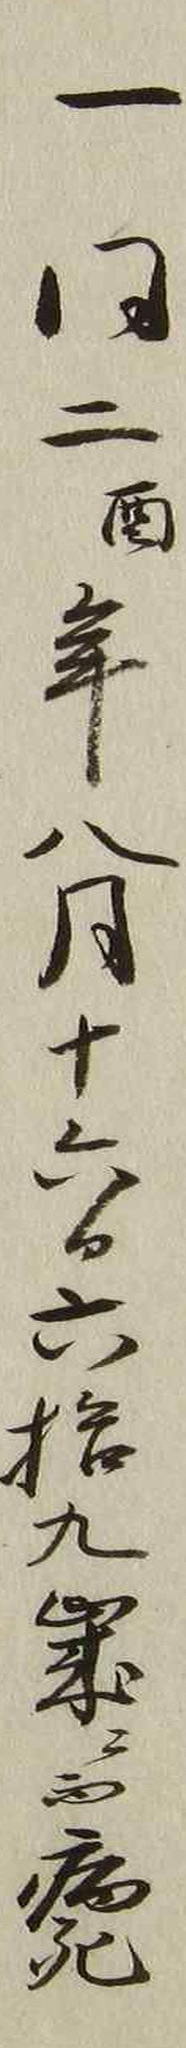一同二西年八月十六日六拾九歳ニ而病死
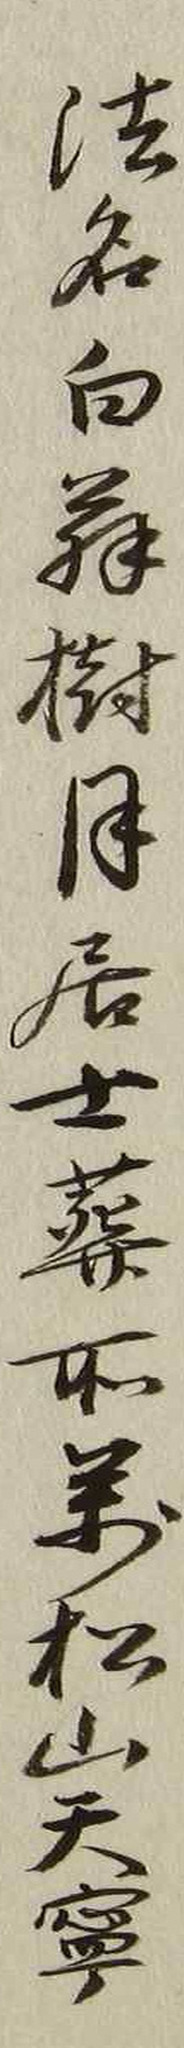法名白翁樹月居士葬所万松山天寧
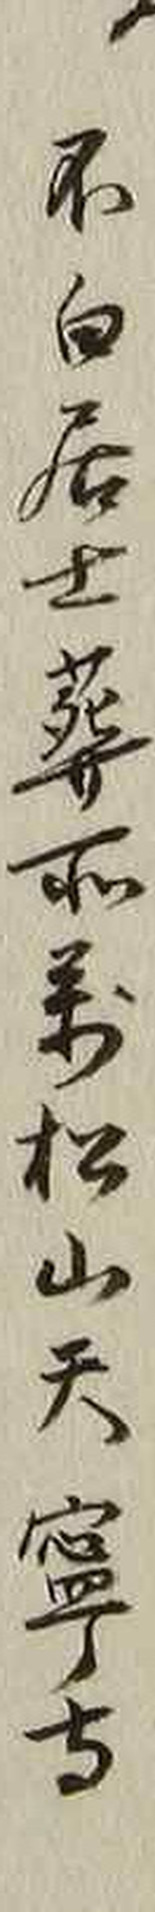法名白翁樹月居士葬所万松山天寧
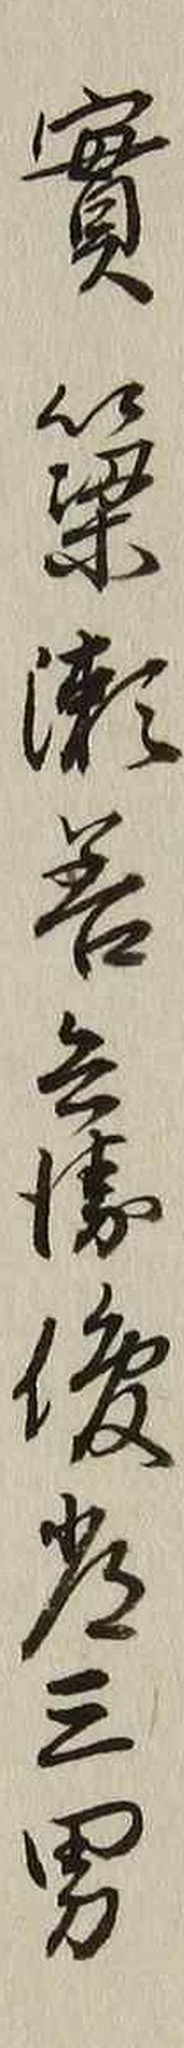実簗瀬善兵衛俊常三男
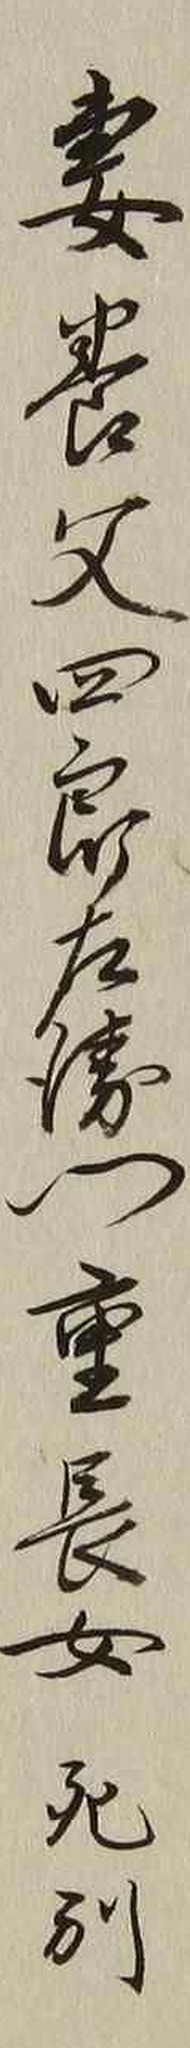妻養父四郎左衛門重長女死別
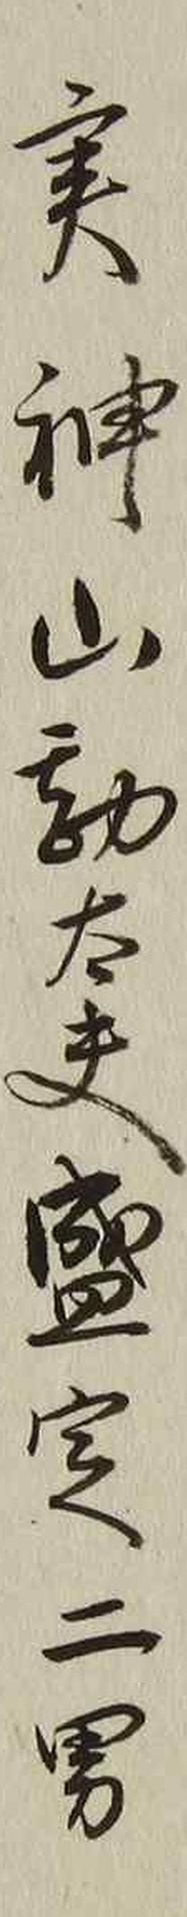実神山勘太夫盛定二男
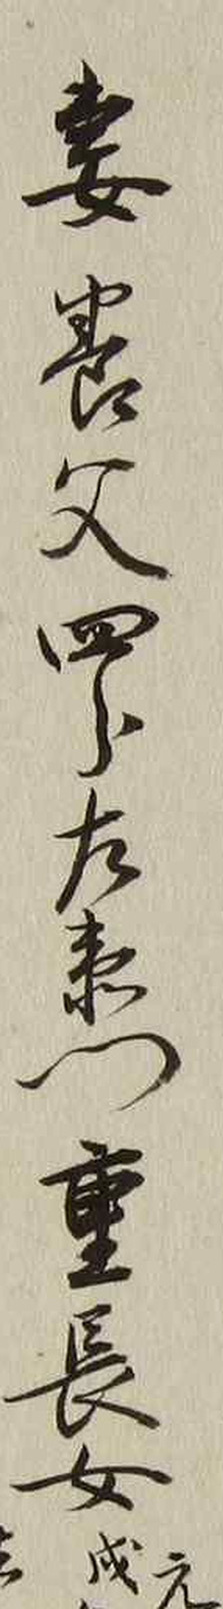妻養父四郎左衛門重長女死別
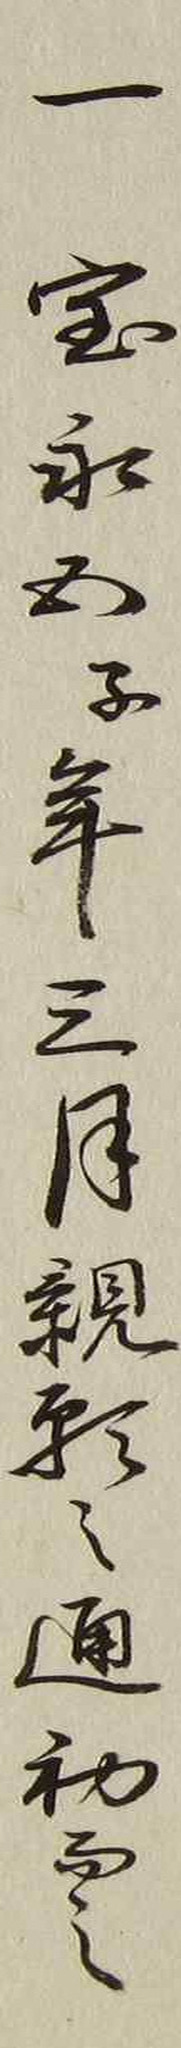一宝永五子年三月親願之通初而之
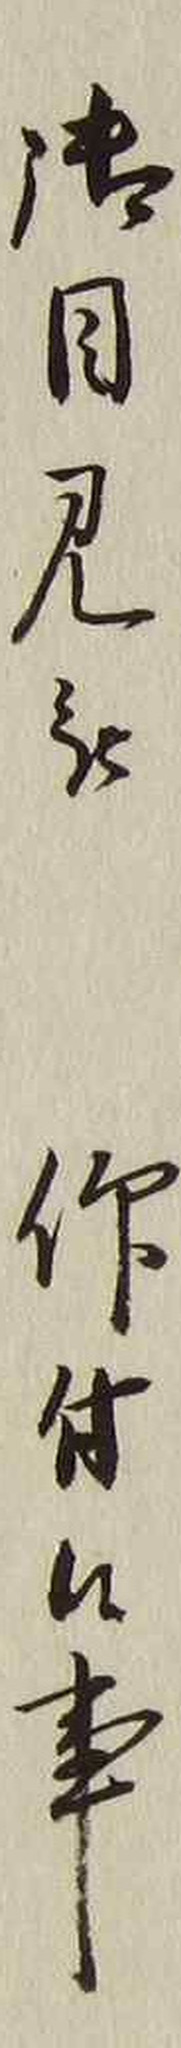御目見被仰付候事
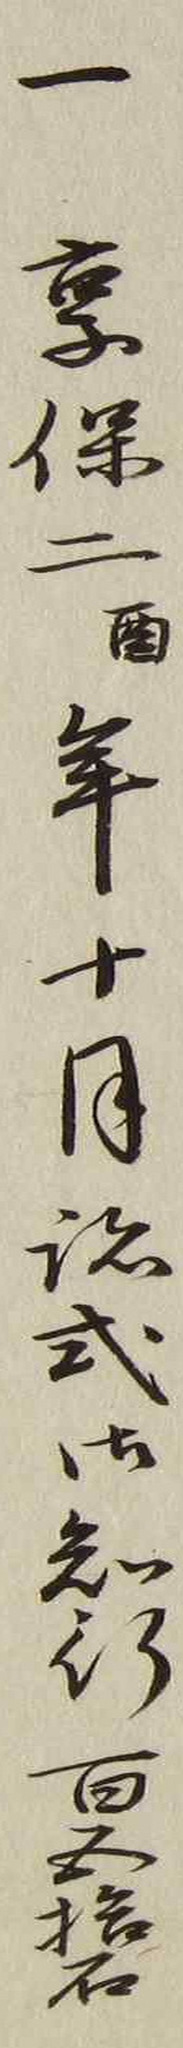一享保二酉年十月跡式御知行百五拾石

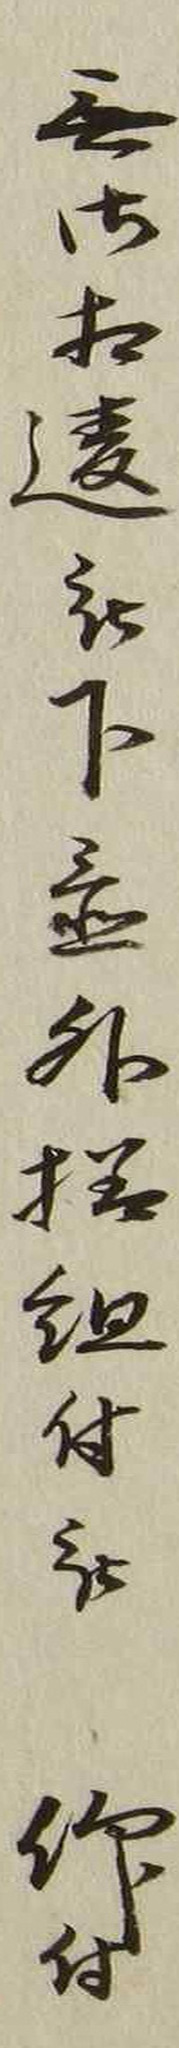無御相違被下置外様組付被仰付
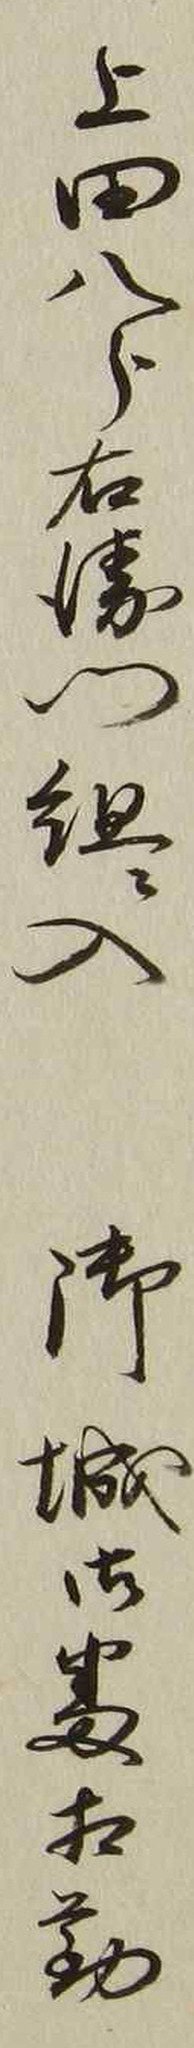上田八郎右衛門組ニ入御城御番相勤
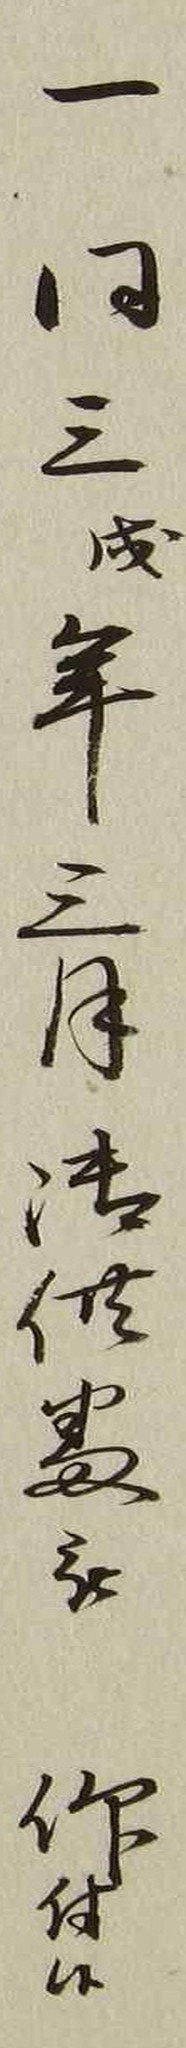一同三戌年三月御供番被仰付候
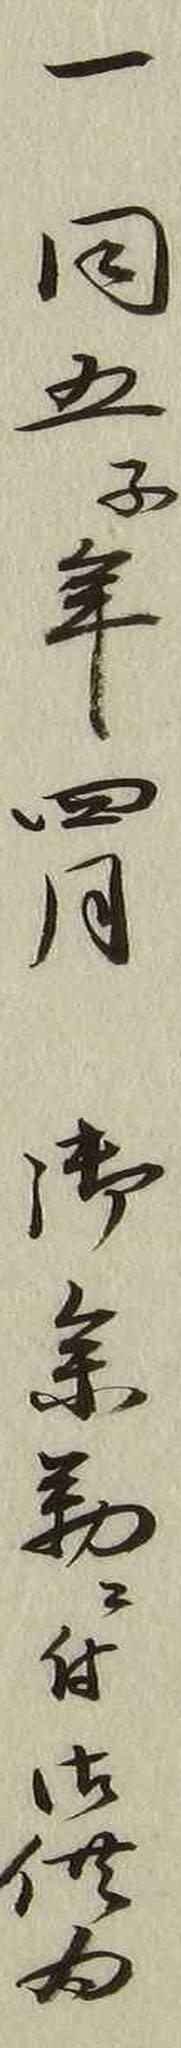一同五子年四月御参勤ニ付御供為
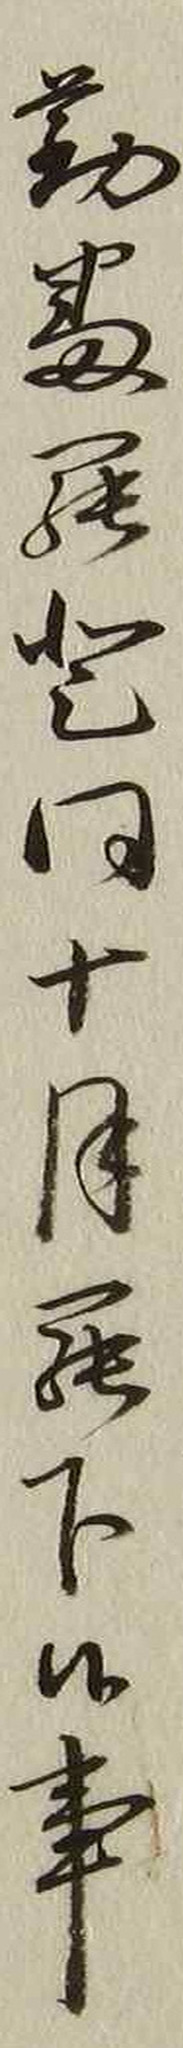勤番罷登同十月罷下候事
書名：諸士系譜　巻之149　そ之部2
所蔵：会津若松市立会津図書館
